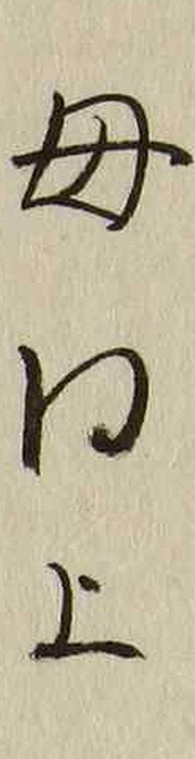母同上
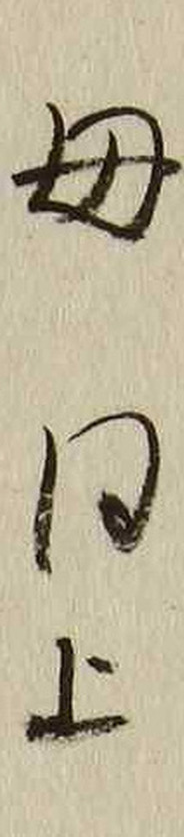母同上
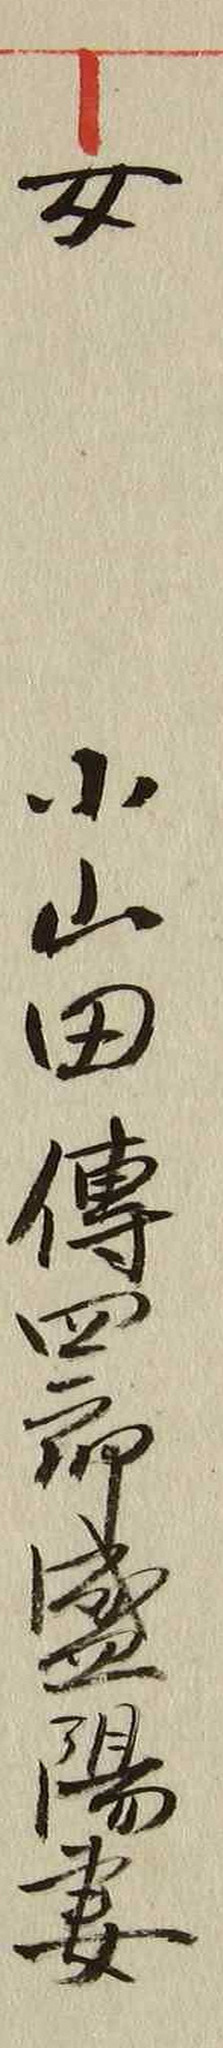女小山田伝四郎盛陽妻
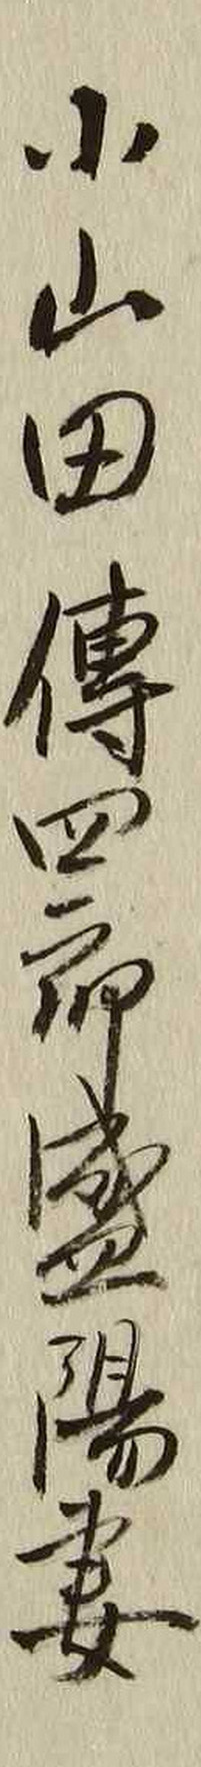女小山田伝四郎盛陽妻
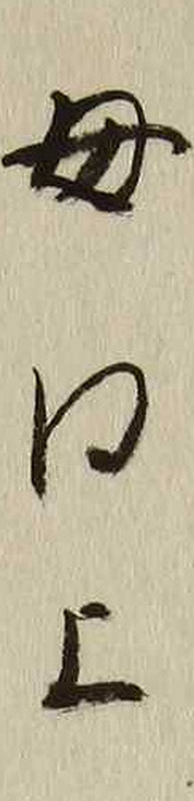母同上
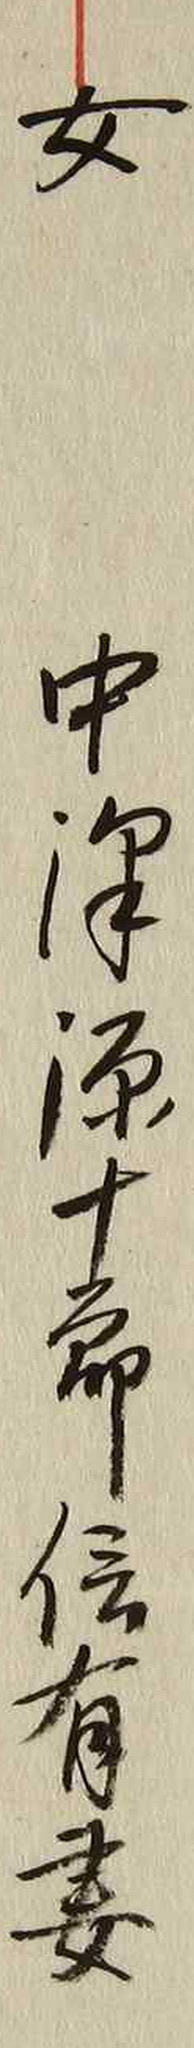女中沢源十郎信有妻
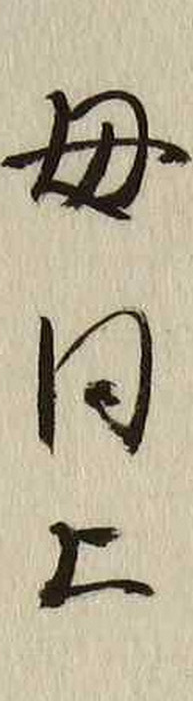母同上
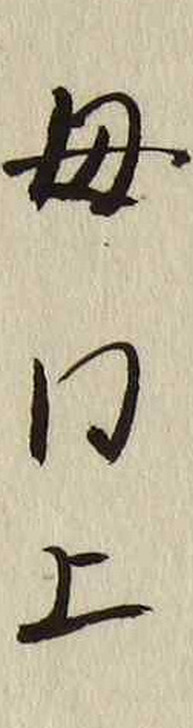母同上
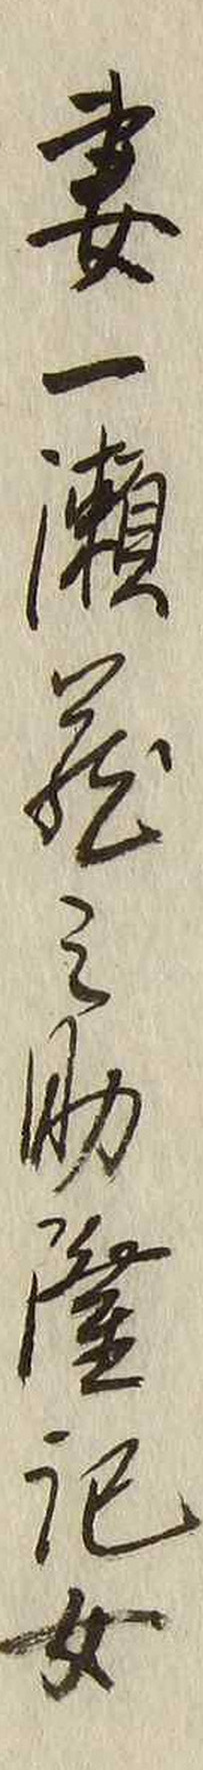妻瀬一蔵之助隆記女

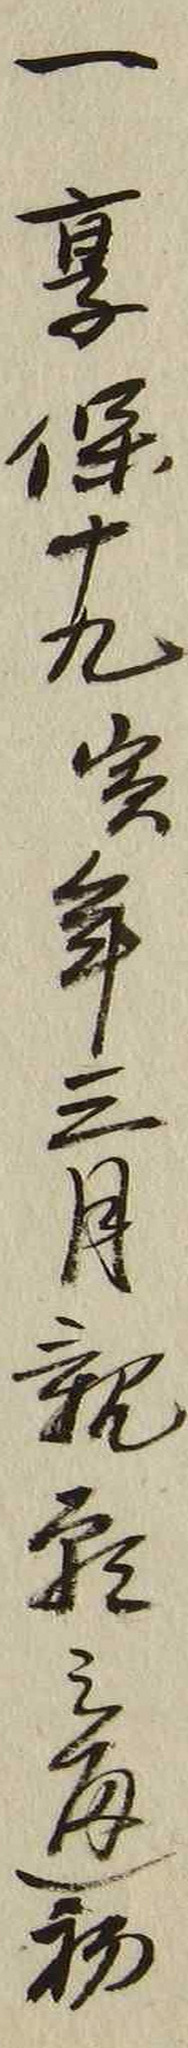一享保十九寅年三月親願之通初
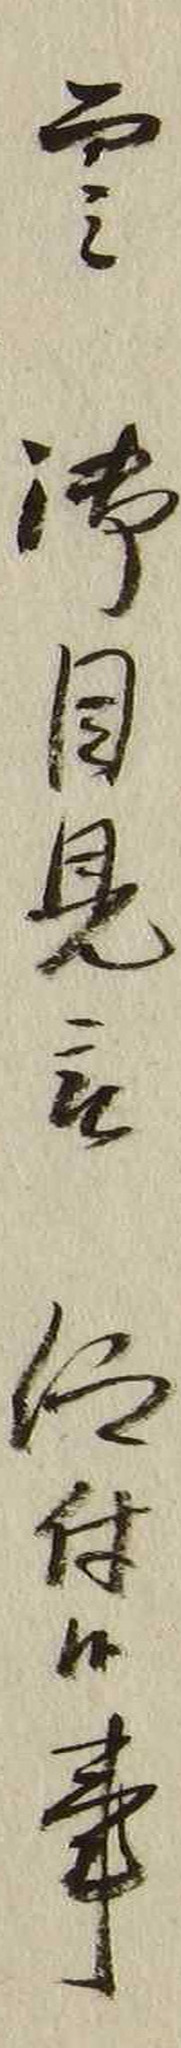而之御目見被仰付候事
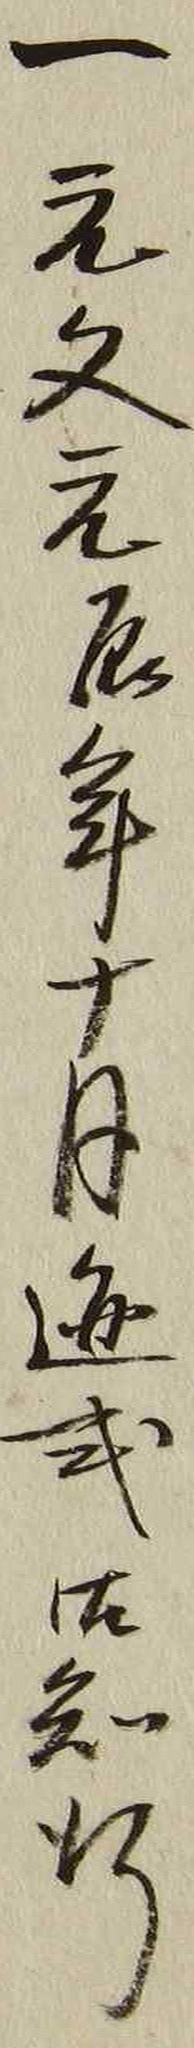一元文元辰年十月迹式御知行
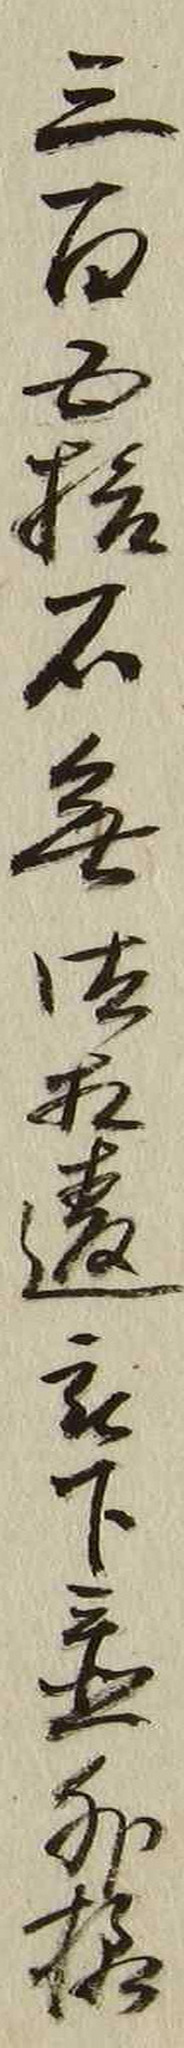三百五拾石無御相違被下置外様
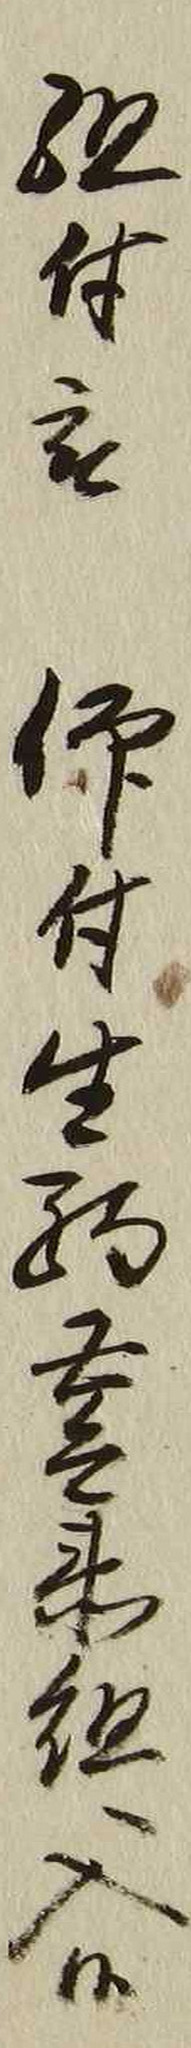組付被仰付生駒五兵衛組へ入候
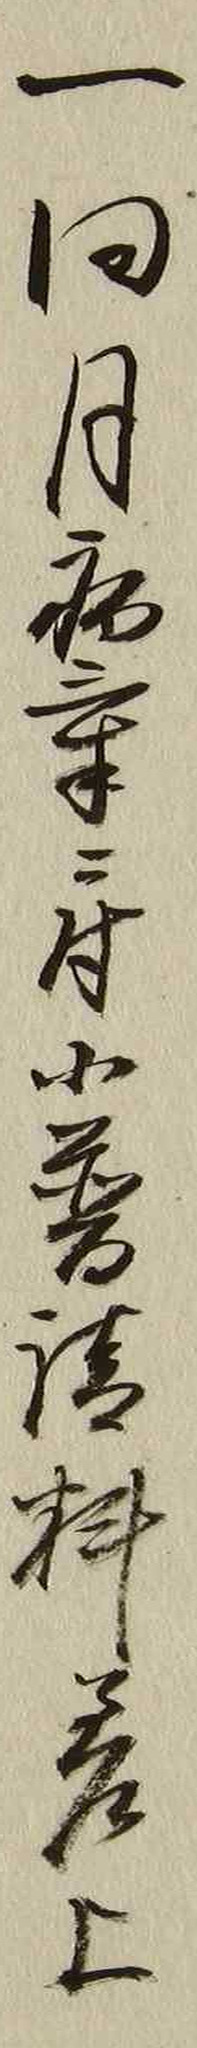一同月病気ニ付小普請料差上
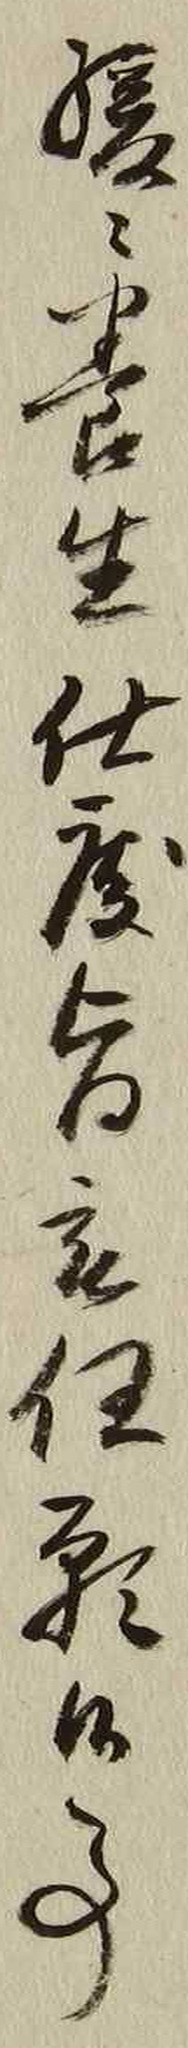緩々養生仕度旨被任願候事
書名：諸士系譜　巻之356　す之部6
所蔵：会津若松市立会津図書館
